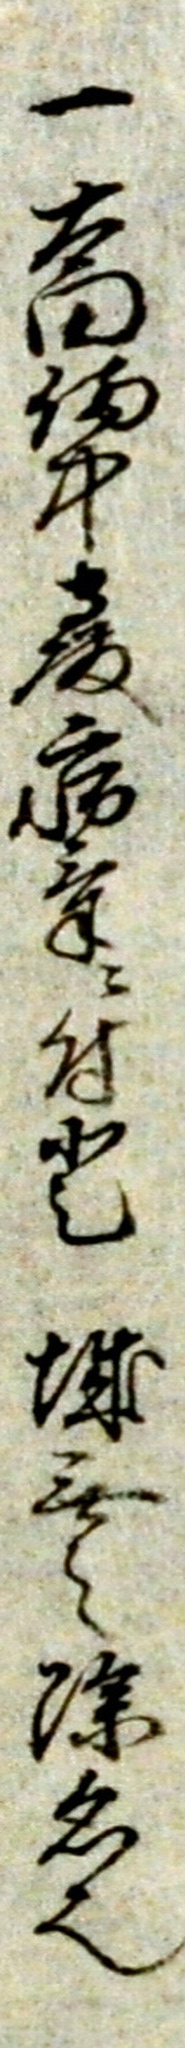一太田備中守殿病気ニ付登城無之除名也
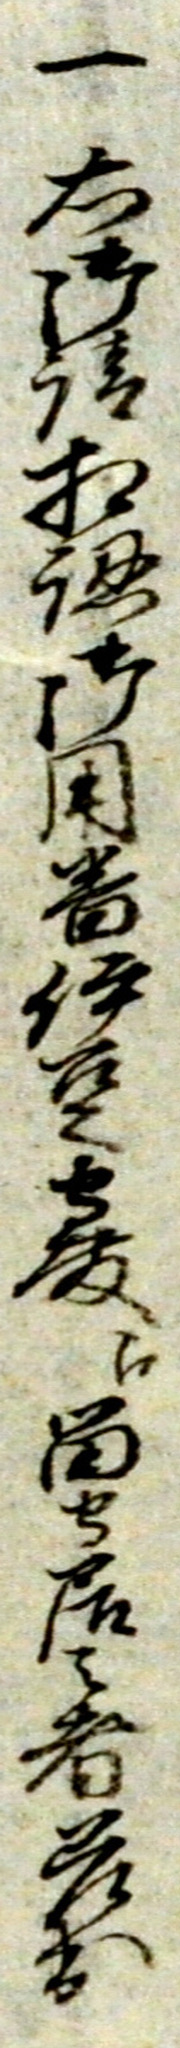一右御請相認御用番伊豆守殿江留守居之者差出
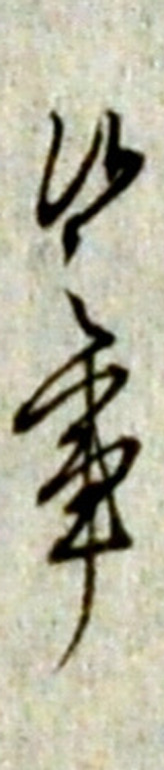候之事
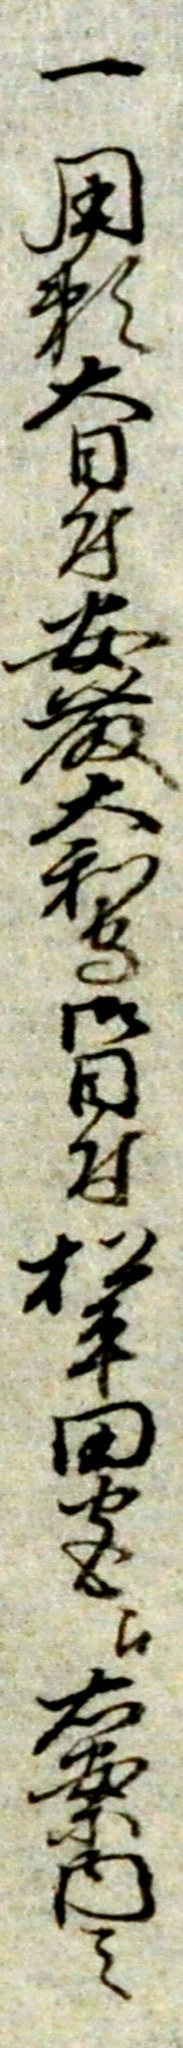一用頼大目付安藤大和守御目付松平田宮江右案内之
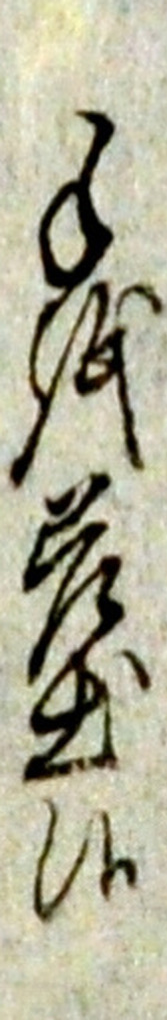手紙差出候
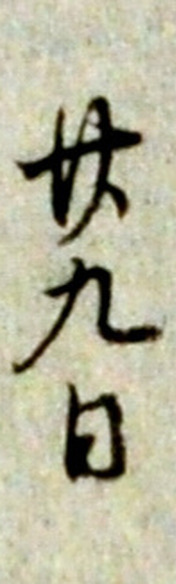廿九日
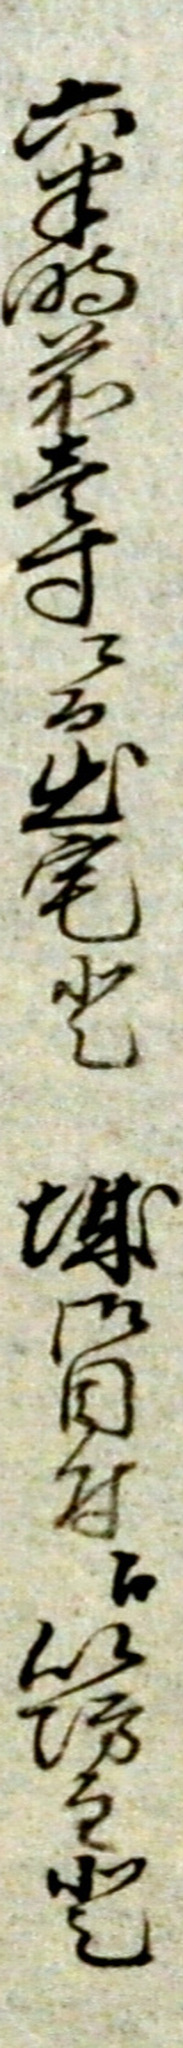六半時前壱寸ニ出立登城御目被以坊主登
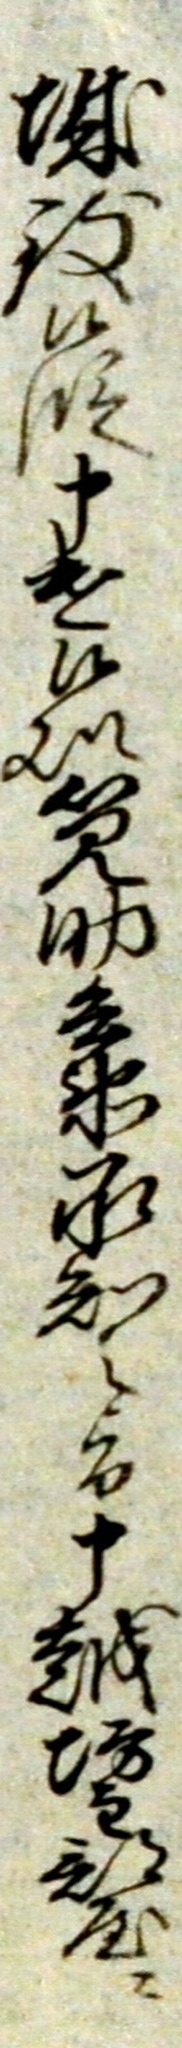城致候段申遣候処筧助兵衛承知之旨申越坊主部屋ニ
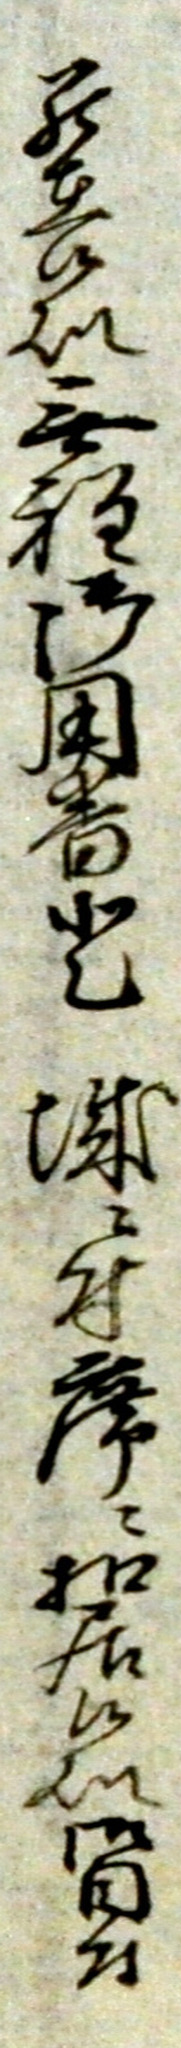罷在候処無程御用番登城二付席ニ扣居候処御目付
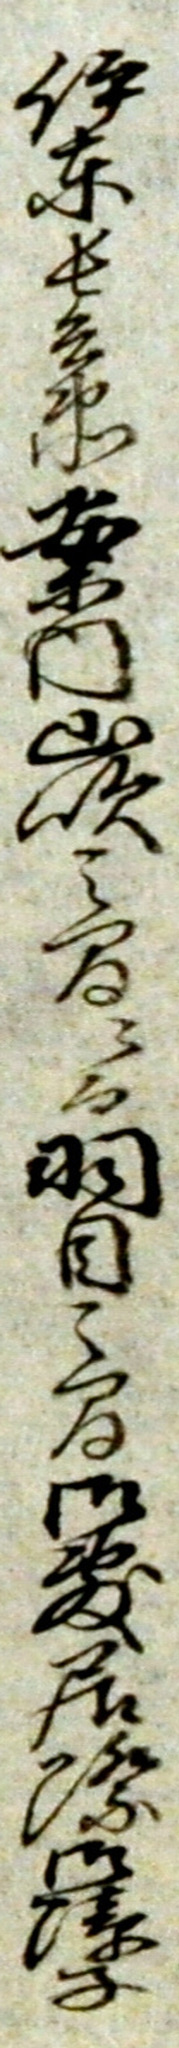伊東長兵衛案内山吹之ニ而羽目之間御敷居際御障子
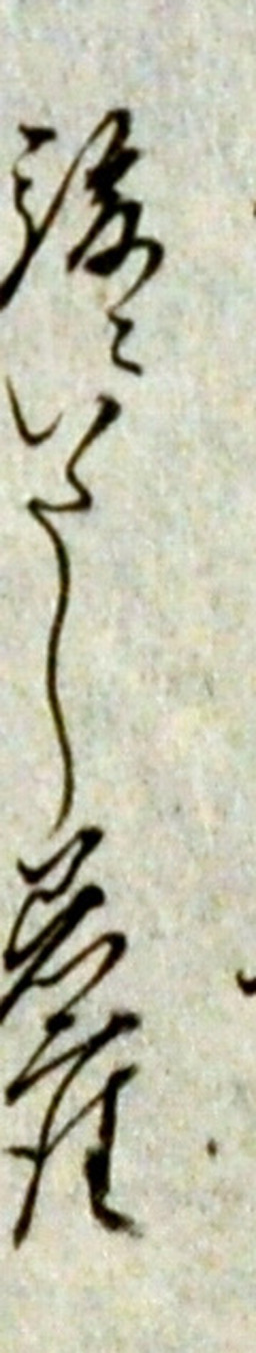後ニいたし着座

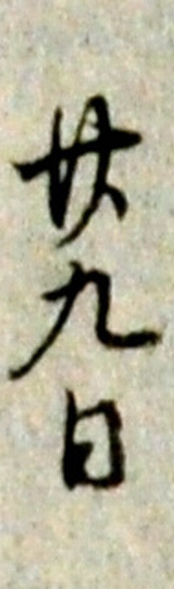廿九日
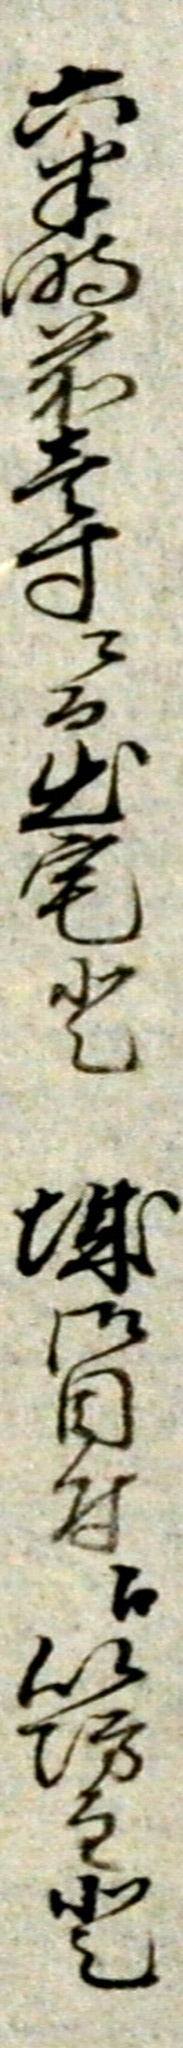六半時前壱寸ニ而出宅登城御目付江以坊主登
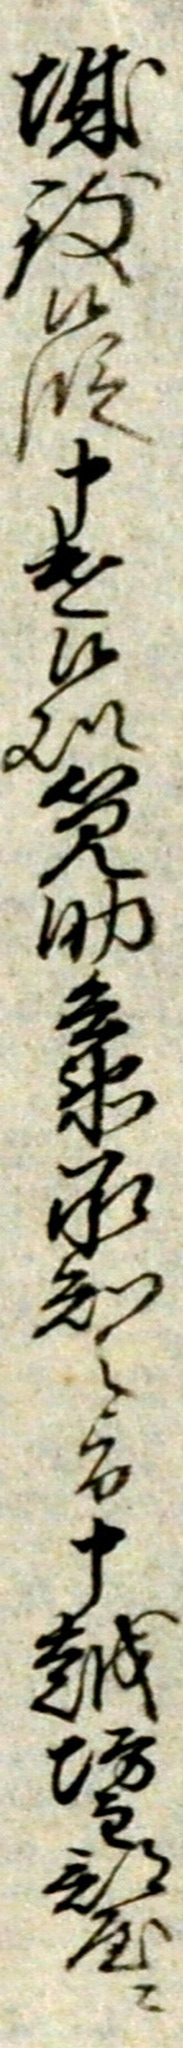城致候段申遣候処免筧助兵衛承知之旨申越坊主部屋ニ
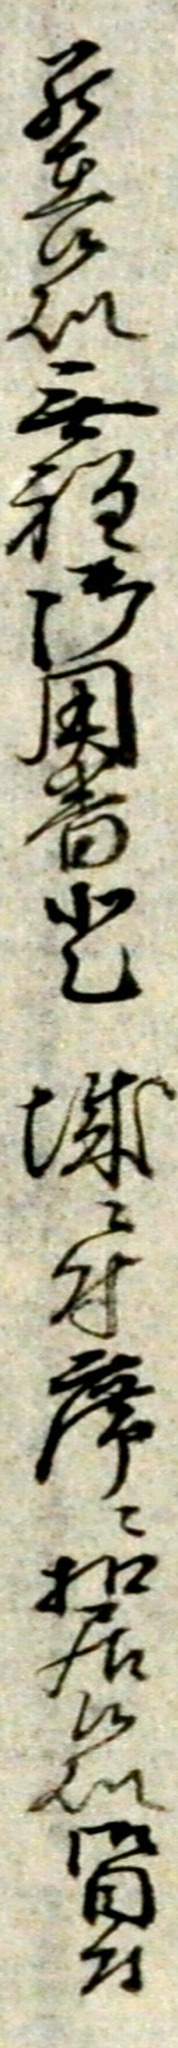罷在候処無程御用番登城ニ付席ニ扣居候処御目付
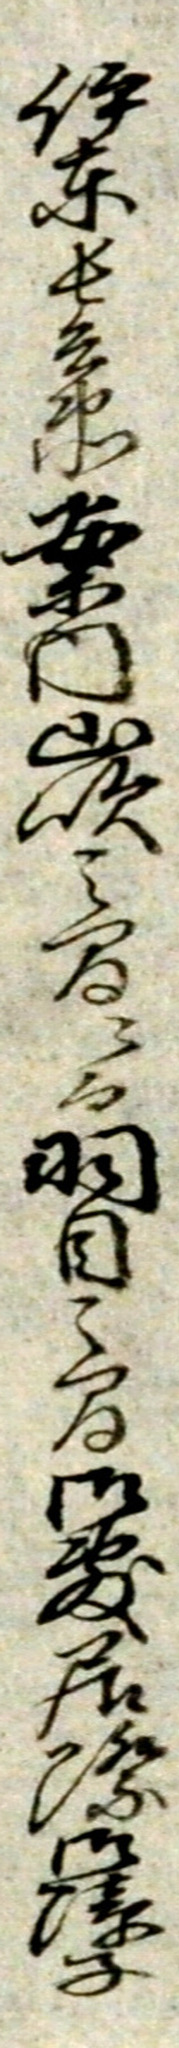伊東長兵衛案内山吹之間ニ而羽目之間御敷居際御障子
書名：日光御名代相勤候節ノ留
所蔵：伊那市立高遠町図書館・合同会社AMANE
